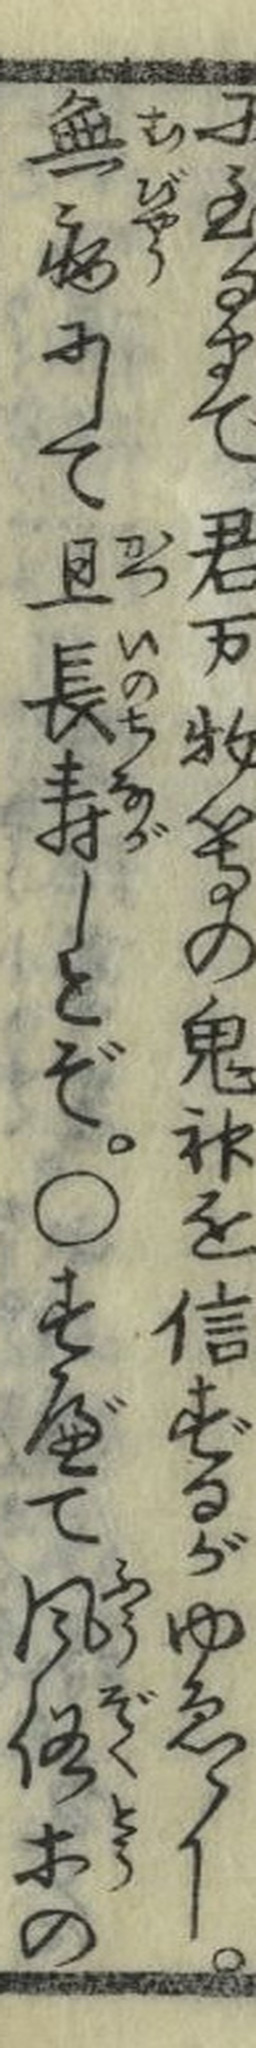無病にして且長寿しとぞ。〇すべて風俗等の

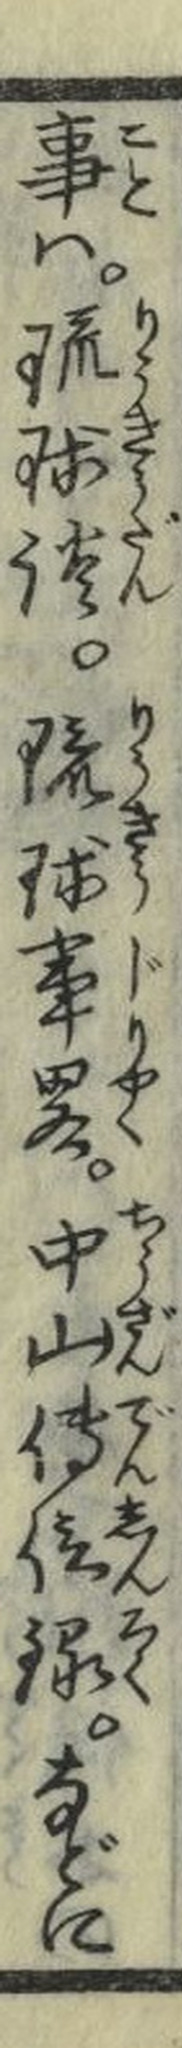事ハ。琉球傳。琉球事畧。中山傳信録。などに
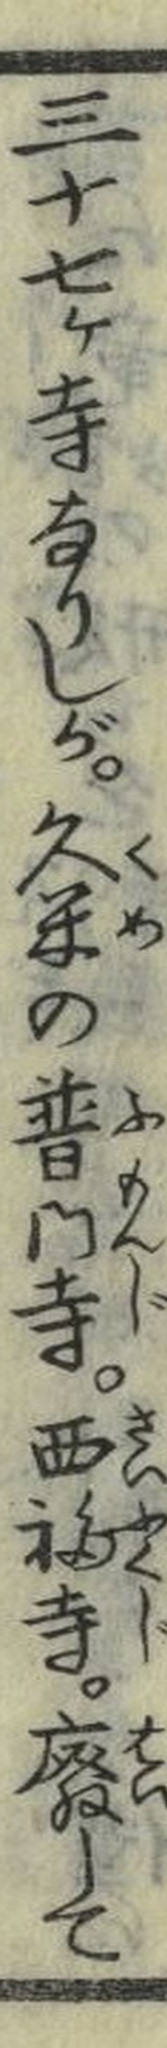三十七ケ寺なりしが。久米の普門寺。西福寺。廃して
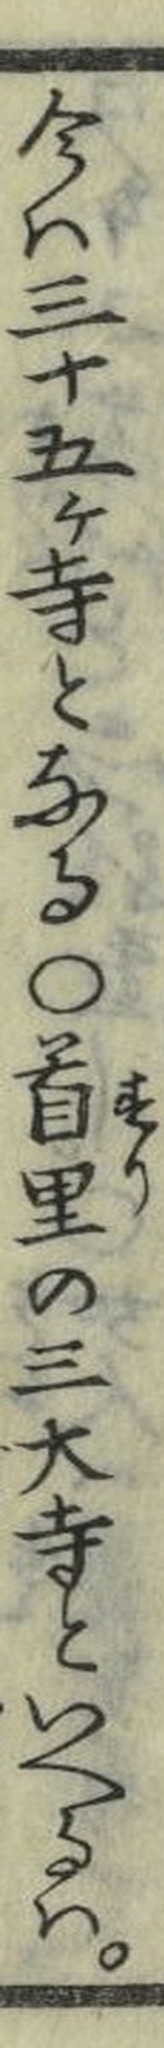今ハ三十五ケ寺となる〇首里の三大寺といへるハ。
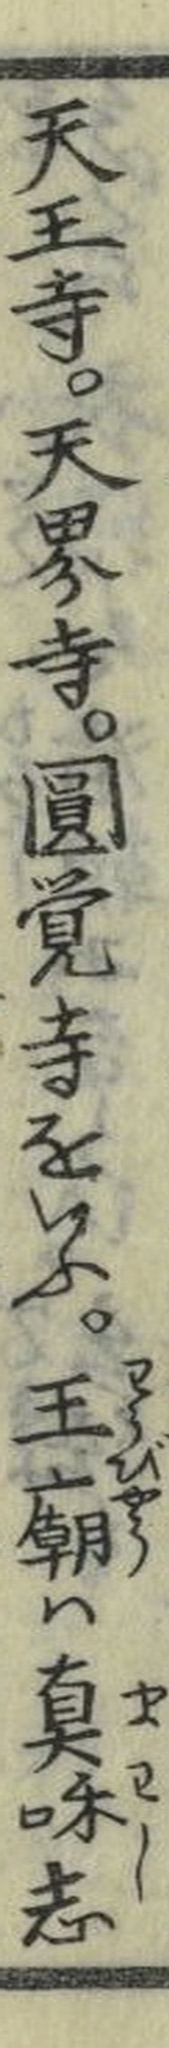天王寺。天界寺。圓覚寺をいふ。王廟ハ真咊志
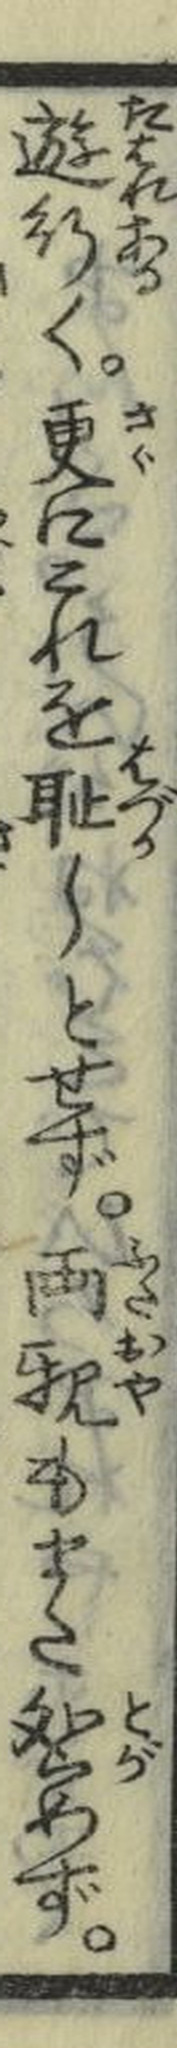遊行く。更にこれを耻しとせず。両親もまた咎めず。
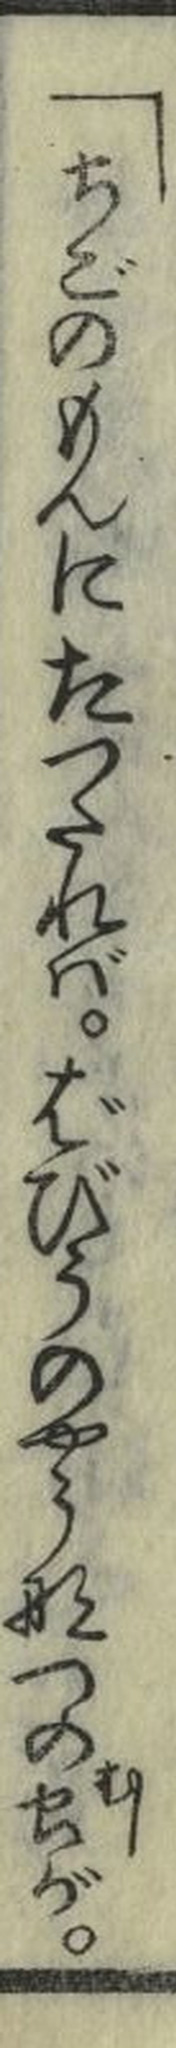〽ちごのもんにたつたれバ。ばびうのやうなつの虫が。

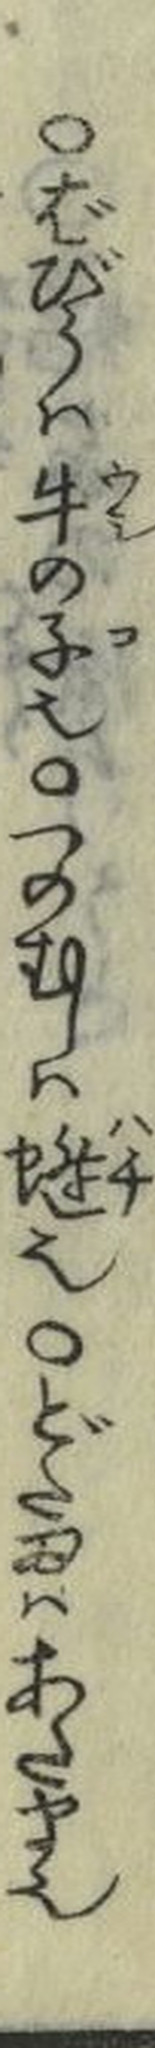〇ばびうハ牛の子也〇つのむしハ蜂也〇どたまハあたま也
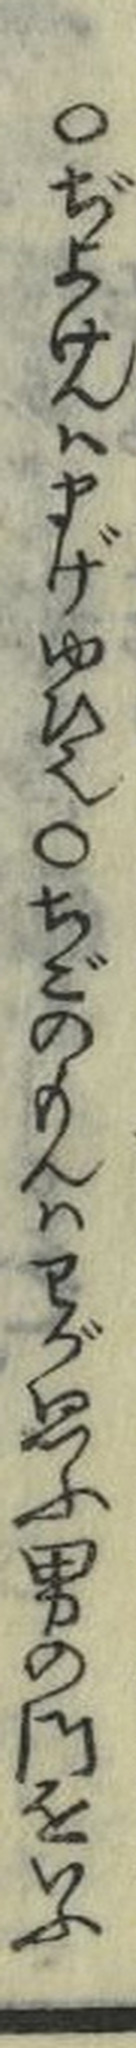〇ぢよけんハまげゆひ也〇ちどのもんハわが思ふ男の門をいふ
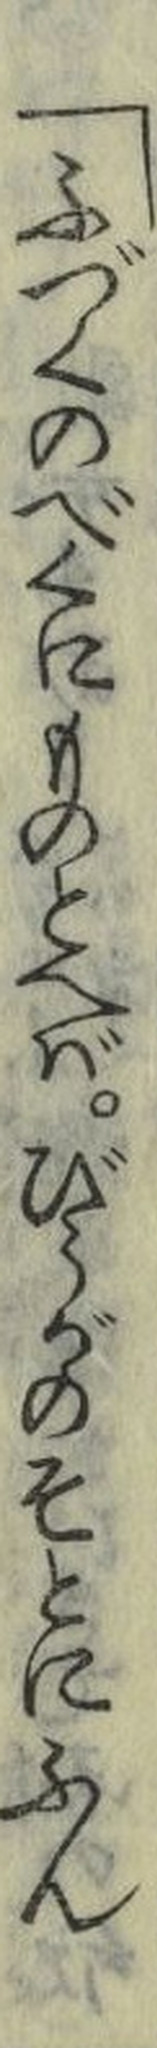〽ふづくのべくにものとへバ。びうがのそとにふん
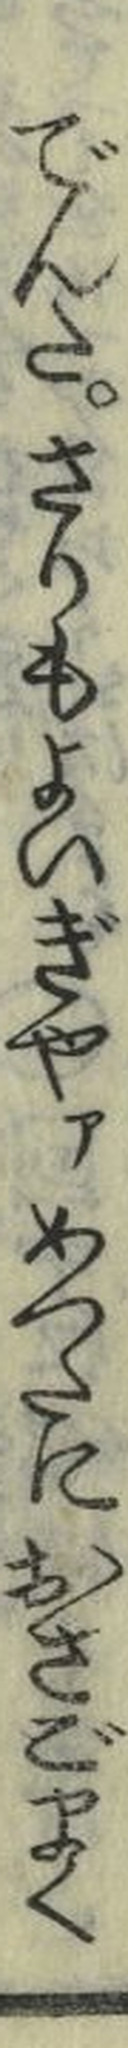でんた。さりもよいぎやァめつたにおさおさごまく
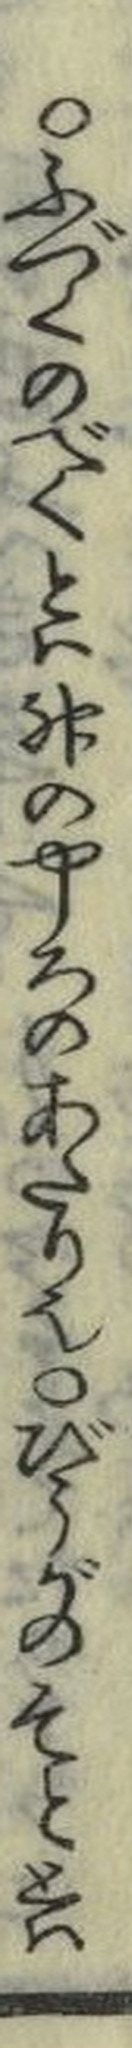〇ふづくのべくとハ神のやしろのあたり也〇びうがのそととハ
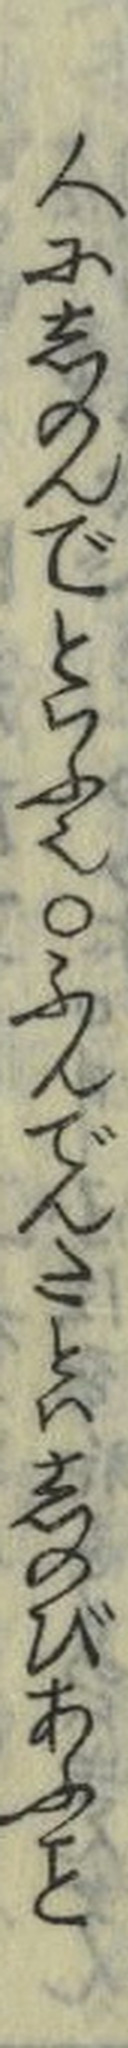人にしのんでといふ也〇ふんでんたとハしのびあふこと
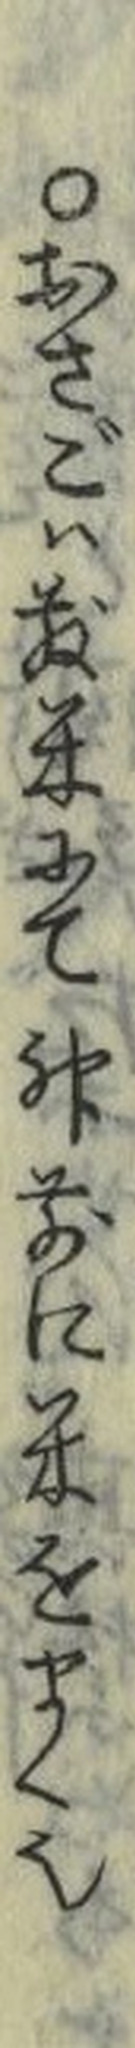〇おさごハ前米にて神前に米をまく也
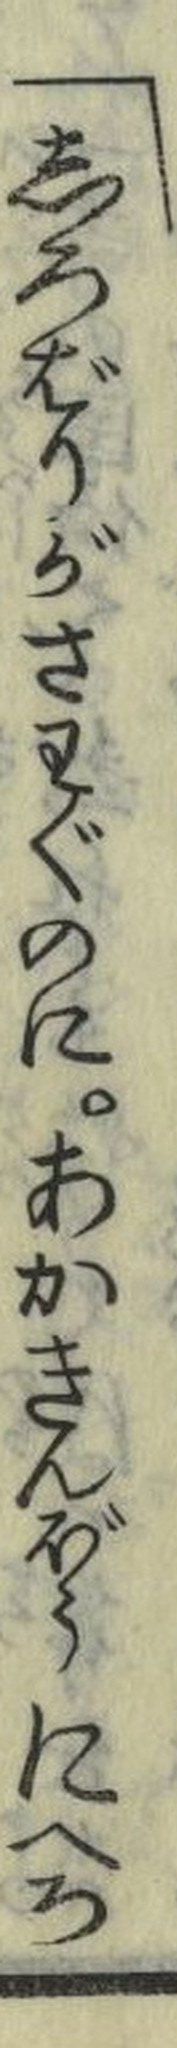〽しろばりがさりぐのに。あかきんぼうにへろ
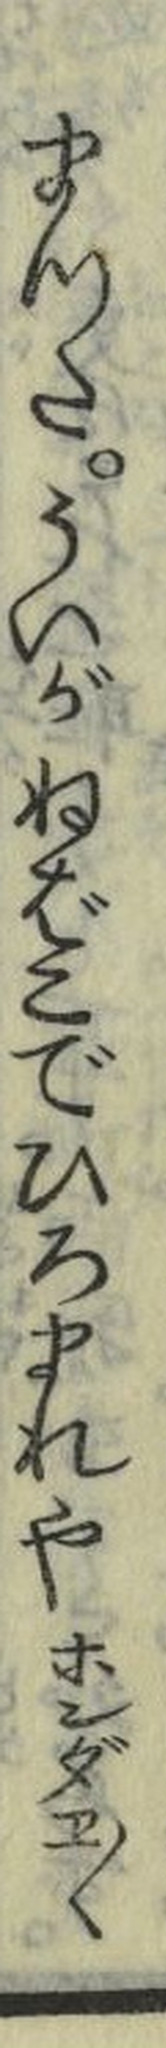まつた。ういがねばこでひろまれやホンダエ〳〵
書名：琉球奇譚
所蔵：University of the Ryukyus Library
